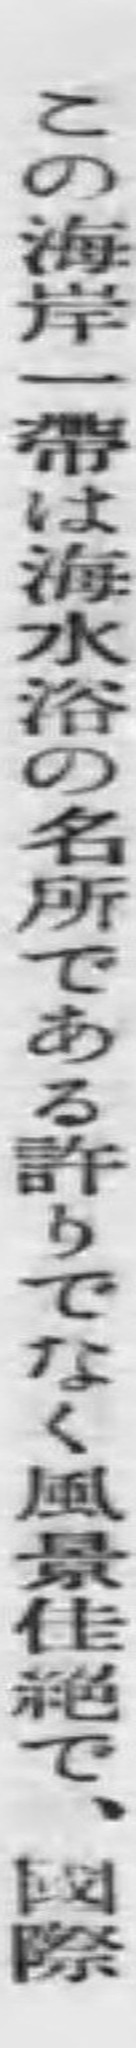この海岸一帯は海水浴の名所である許りでなく風景佳絶で、国際
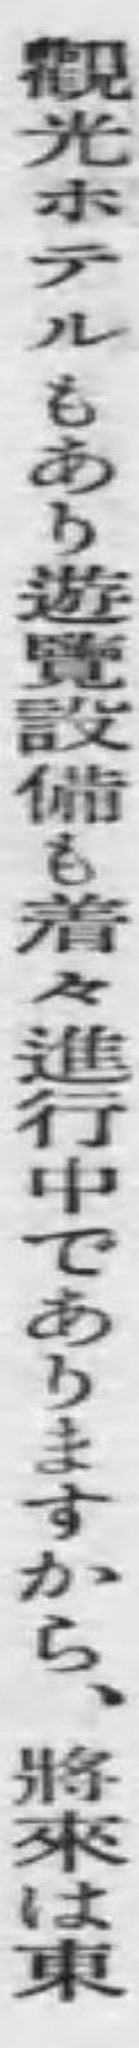観光ホテルもあり遊覧設備も着々進行中でありますから、将来は東
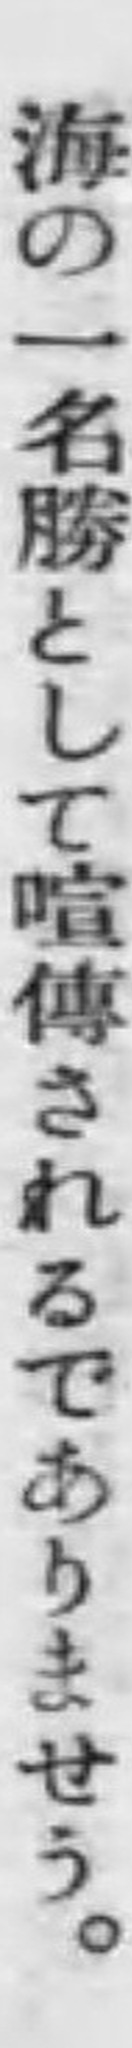海の一名勝として喧伝されるでありませう。
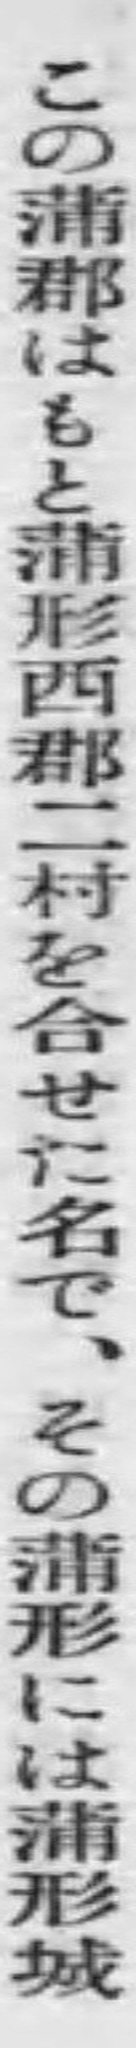この蒲郡はもと蒲形西郡二村を合せた名で、その蒲形には蒲形城
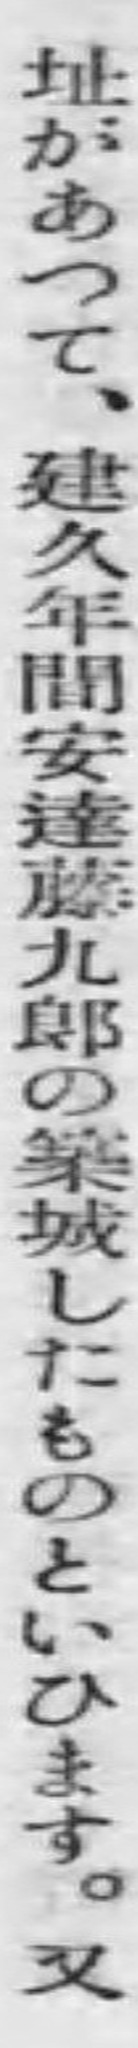址があつて、建久年間安達藤九郎の築城したものといひます。又
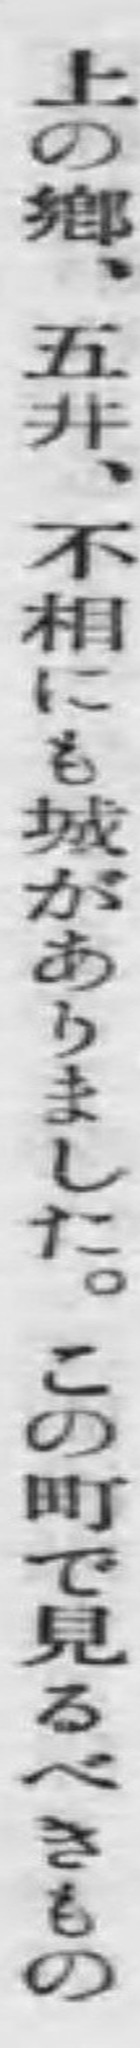上の郷、五井、不相にも城がありました。この町で見るべきもの
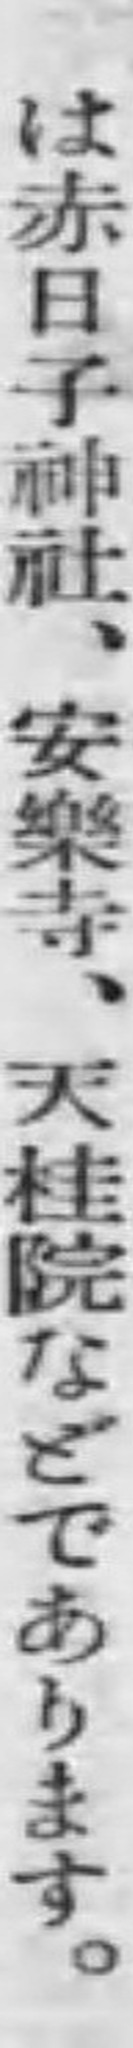は赤日子神社、安楽寺、天桂院などであります。
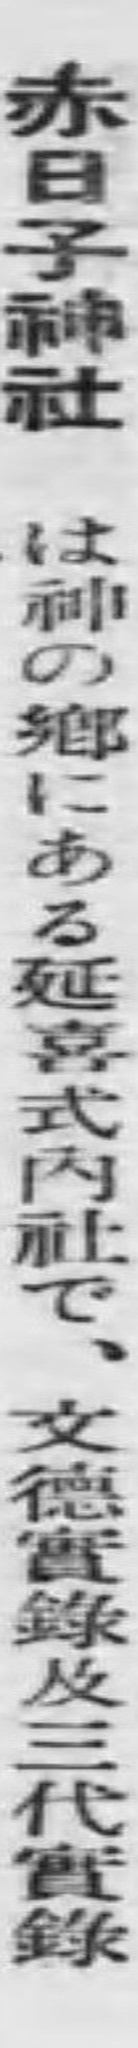赤日子神社は神の郷にある延喜式内社で、文徳実録及三代実録
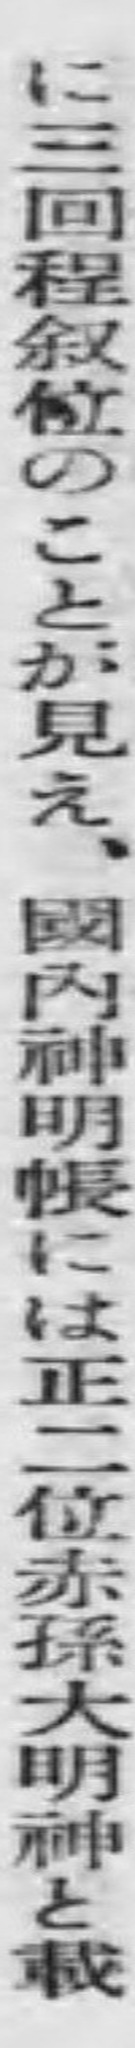に三回程叙位のことが見え、国内神明帳には正二位赤孫大明神と載
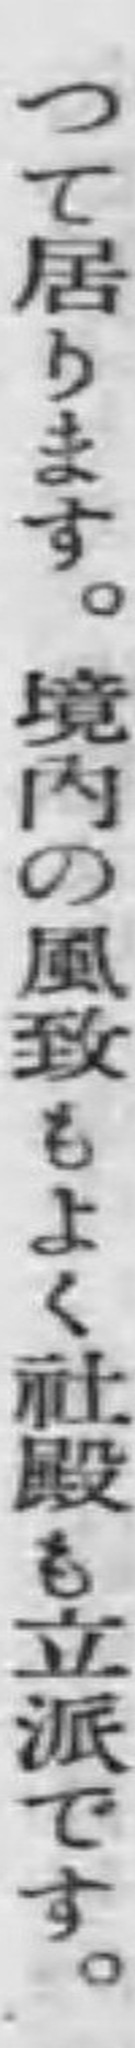つて居ります。境内の風致もよく社殿も立派です。
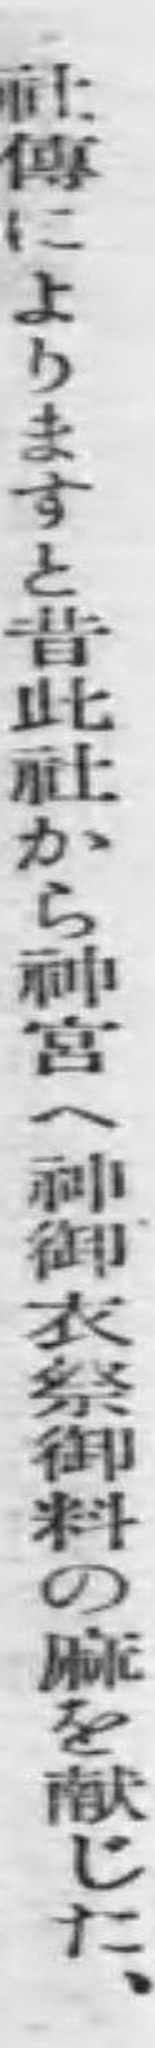社伝によりますと昔此社から神宮へ神御衣祭御料の麻を献じた、
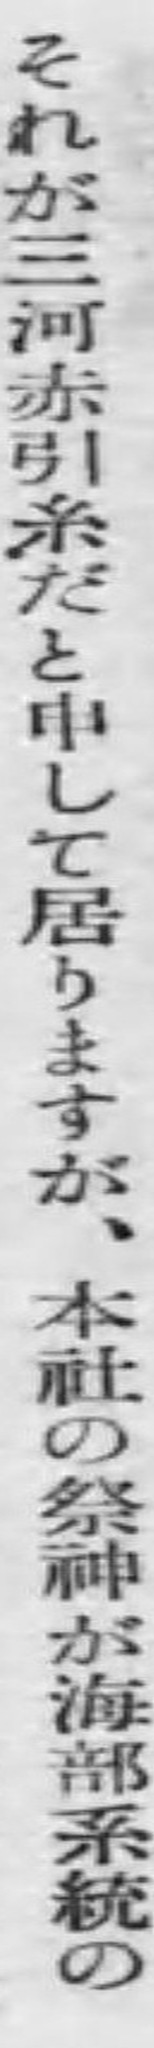それが三河赤引糸だと申して居りますが、本社の祭神が海部系統の
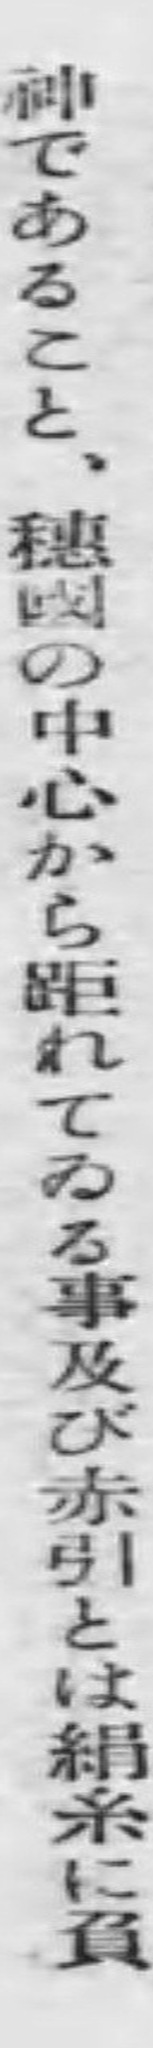神であること、穂国の中心から距れてゐる事及び赤引とは絹糸に負
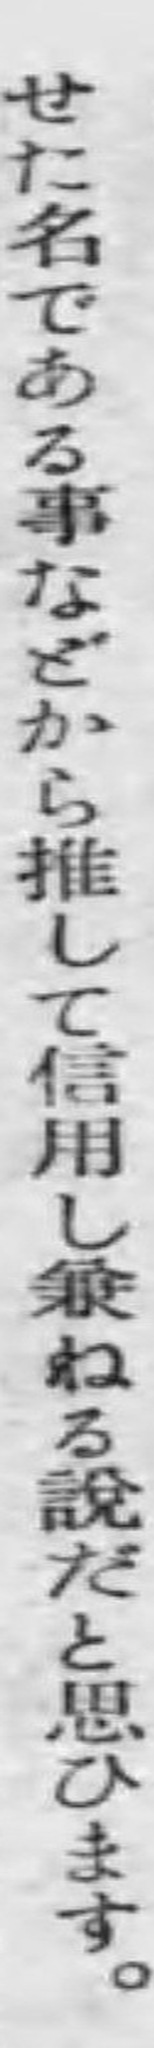せた名である事などから推して信用し兼ねる説だと思ひます。
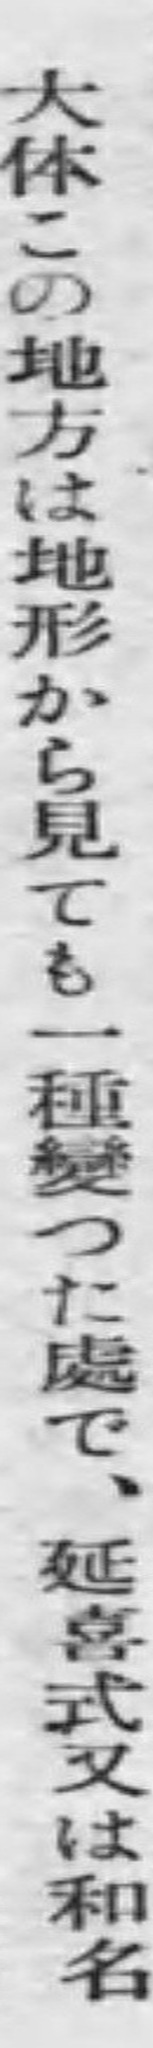大体この地方は地形から見ても一種変つた処で、延喜式又は和名
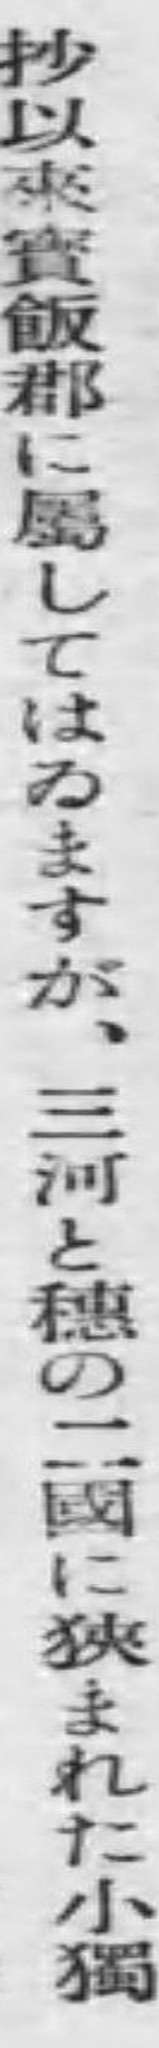抄以来宝飯郡に属してはゐますが、三河と穂の二国に狭まれた小独
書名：東三河道中記 : 豊橋市及其附近案内
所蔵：国立国会図書館 National Diet Library, JAPAN
